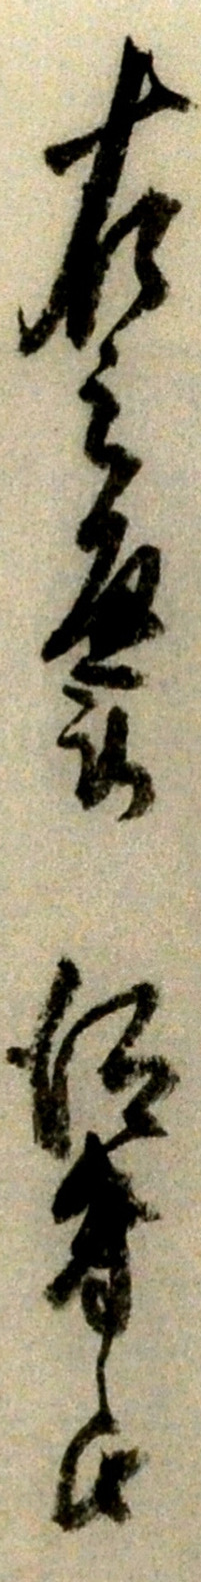右之通被仰付候由
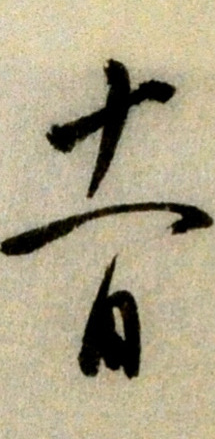十一日
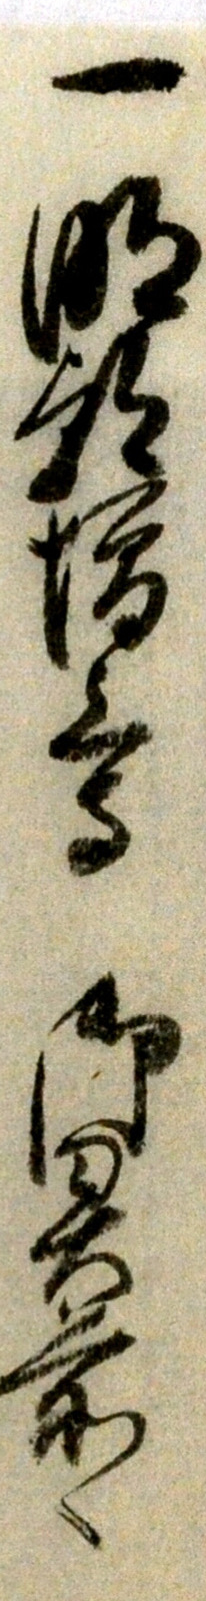一明朝増上寺御霊前へ
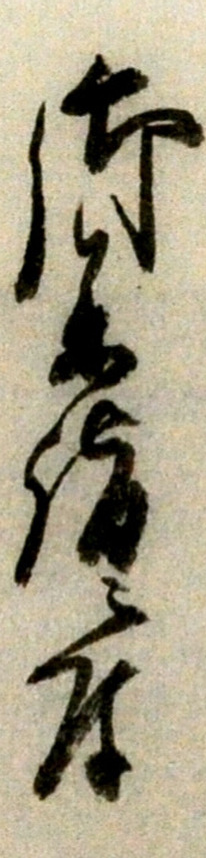御参詣に付
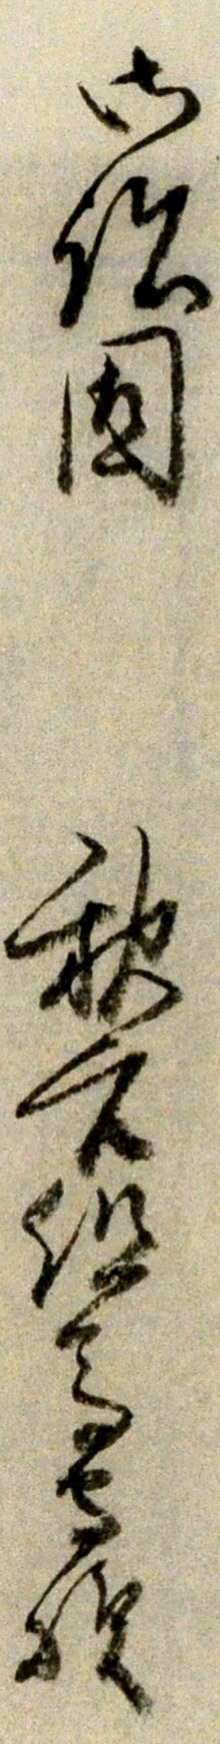御跡固秋元但馬守様
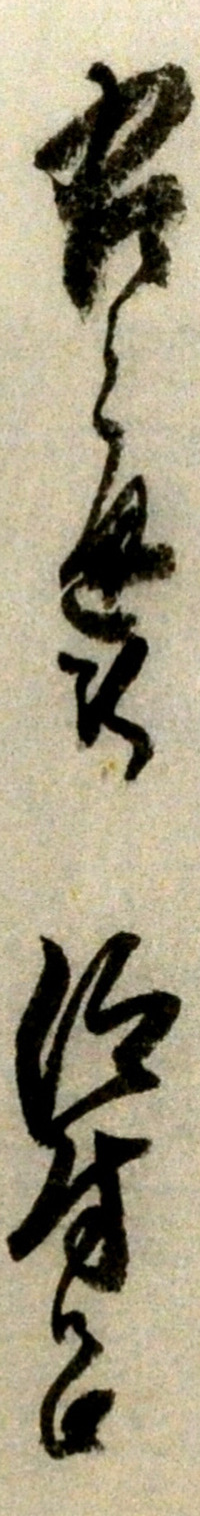右之通被仰付候由
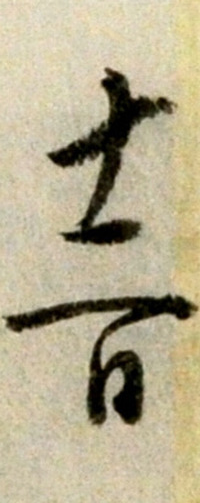十二日
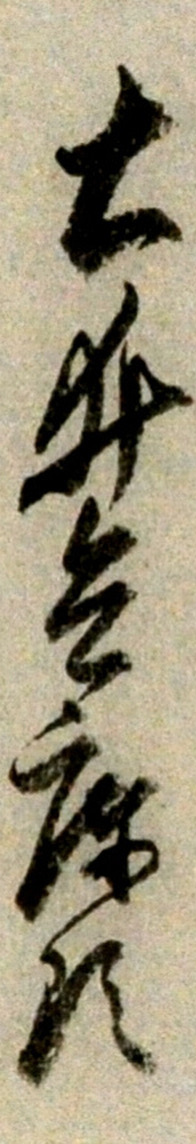土井兵庫頭
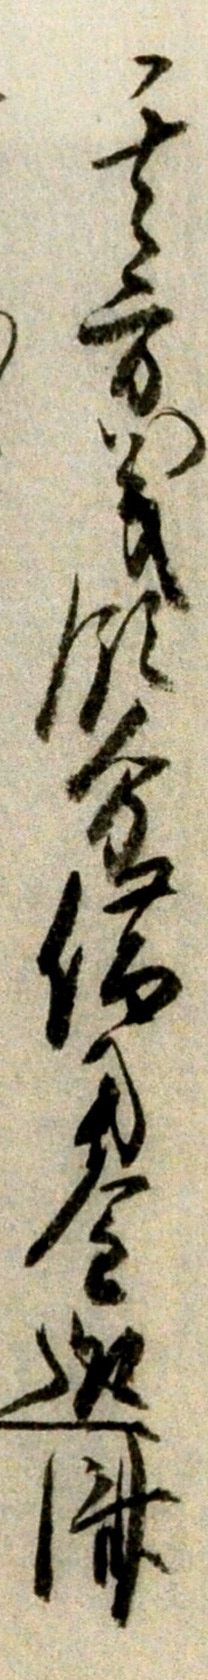其方義領分借用金返済
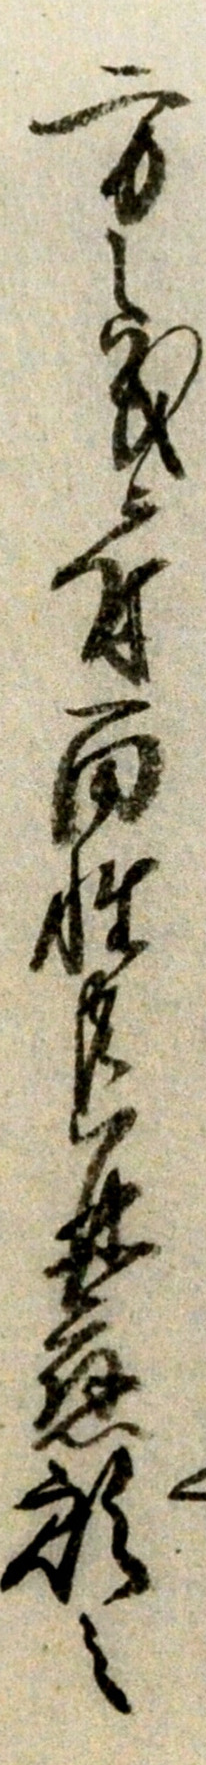方之義に付百姓共再応願之
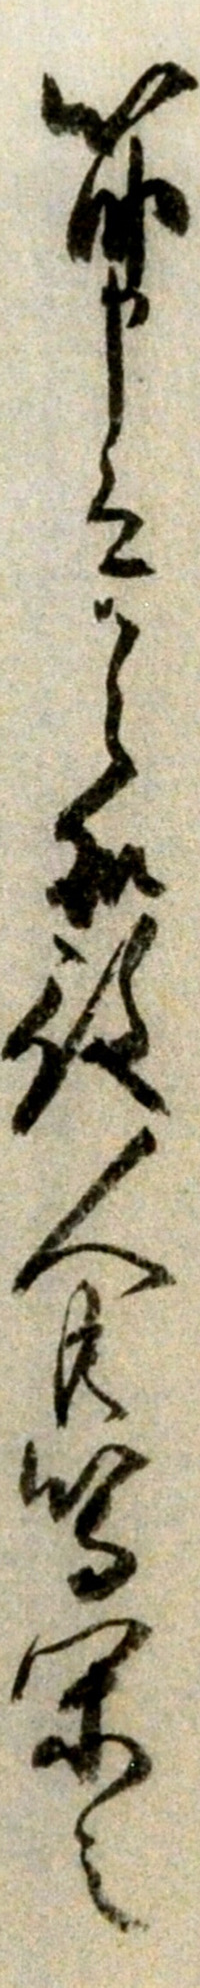筋申立候之処役人共等閑之

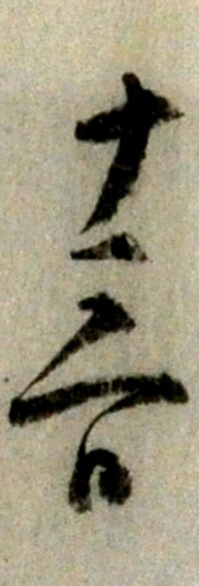十三日
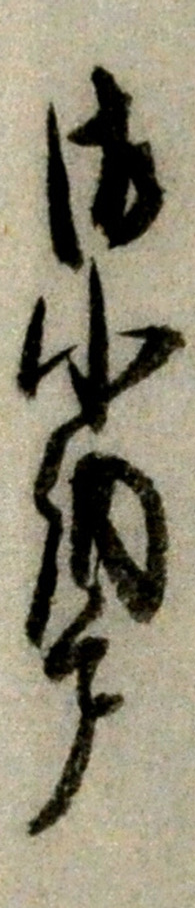御小納戸
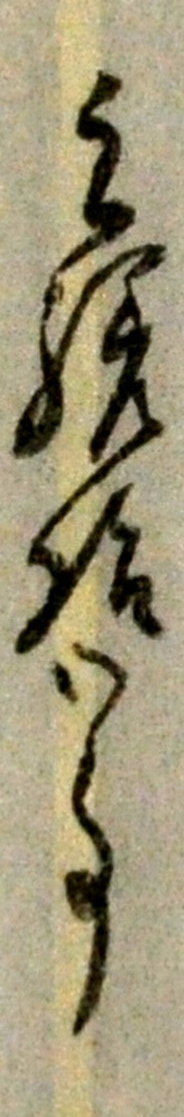主膳様御事
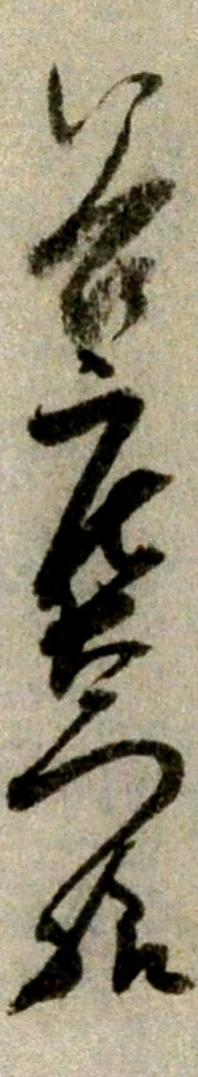谷庄右衛門様
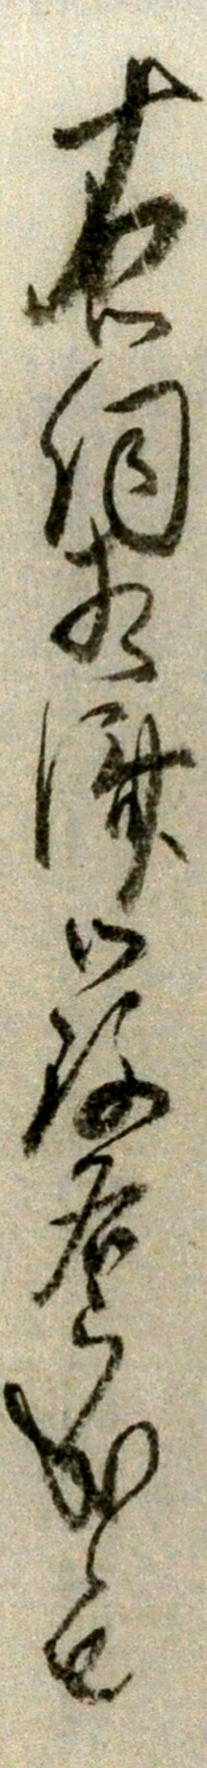右御伺相済御改名被成候由
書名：申合帳〔一括〕
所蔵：伊那市立高遠町図書館・合同会社AMANE
